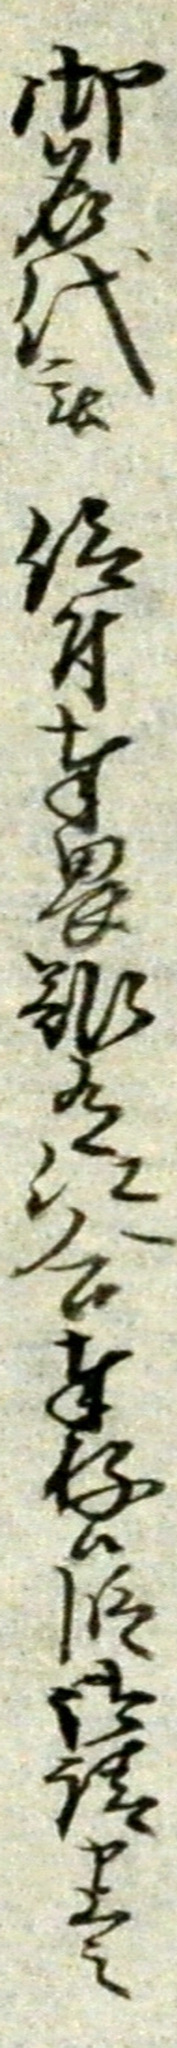御名代被仰付奉畏難有仕合奉存候段御請申上之
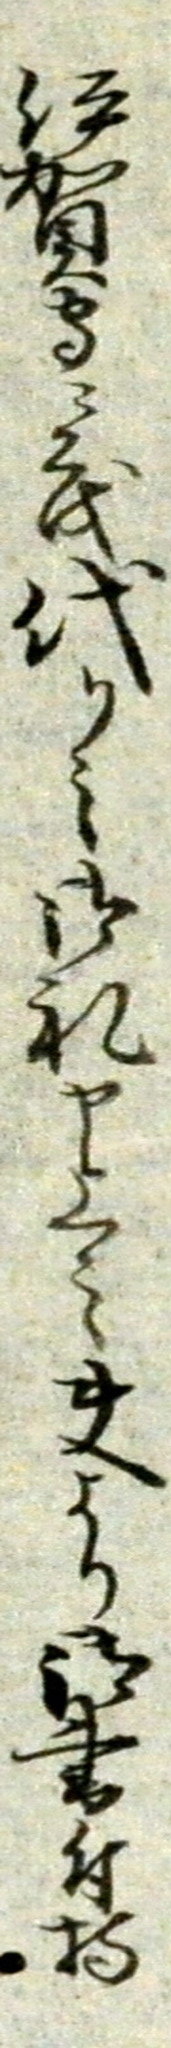伊賀守ニも代り之御礼申上之夫より御書付持
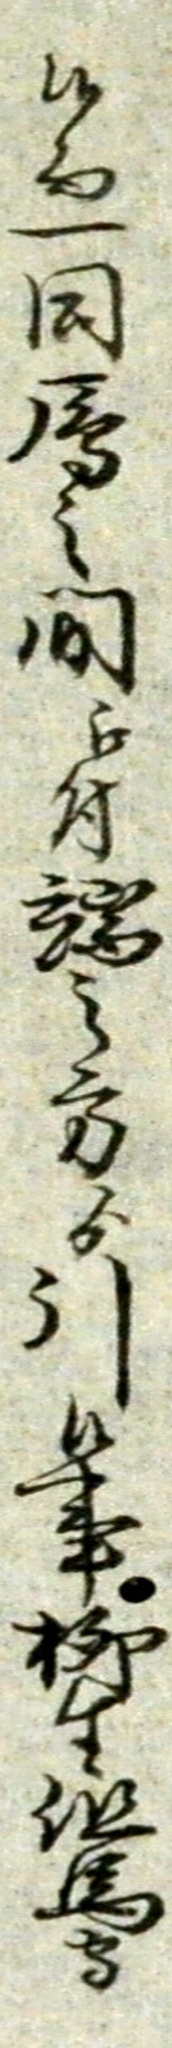候而一同雁之間江付端之方ゟ引候事柳生但馬守
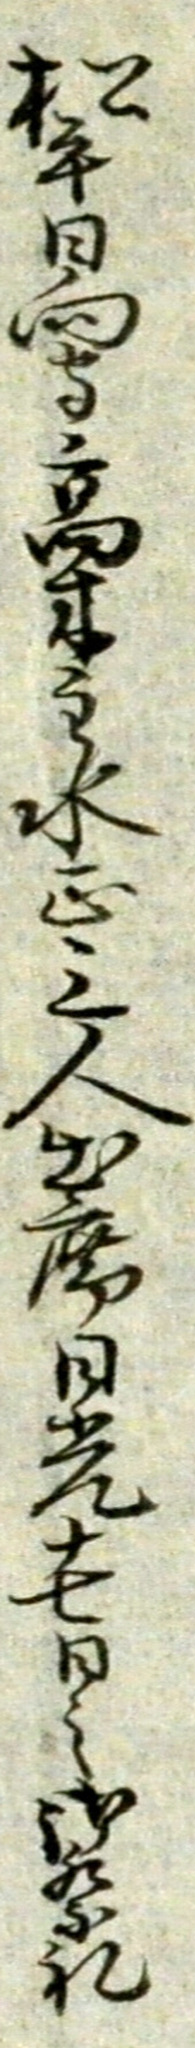松平日向守高木主水正三人出席日光十七日之御祭礼
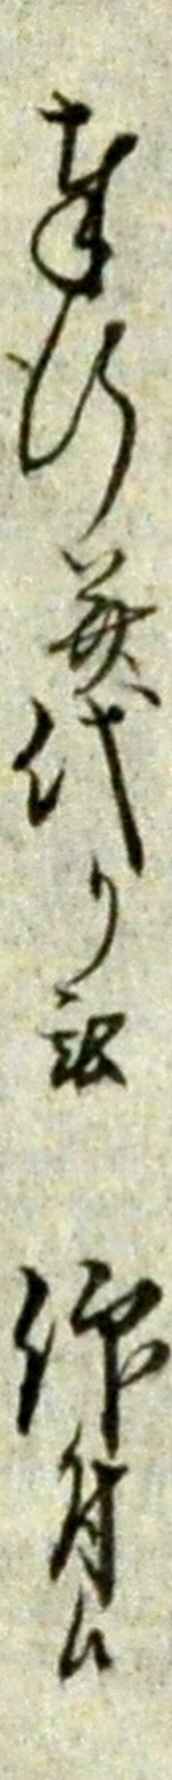奉行幷代り被仰付候
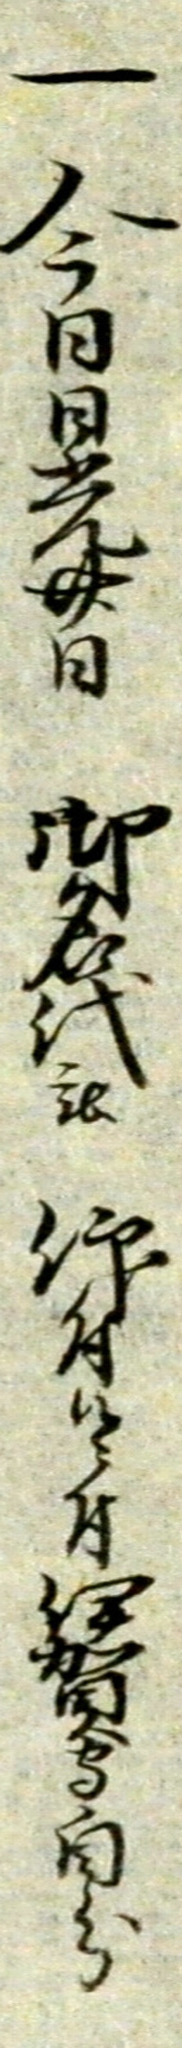一今日日光廿日御名代被仰付候ニ付伊賀守自分
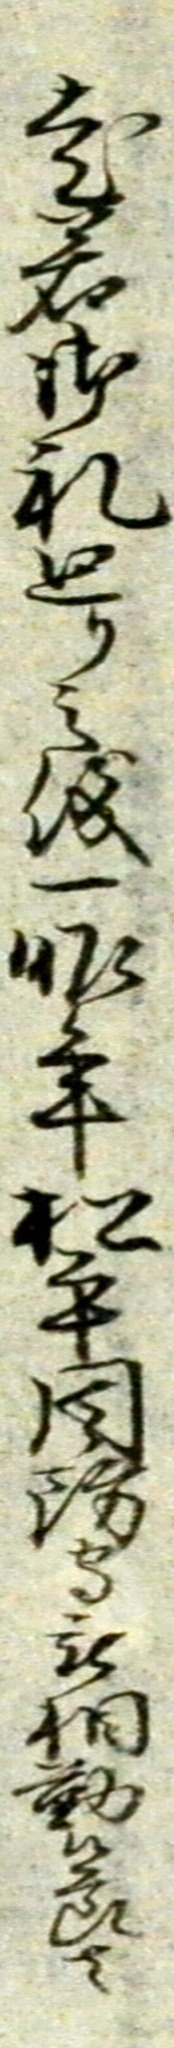老若御礼廻り之儀一昨年松平周防守被相勤候節者
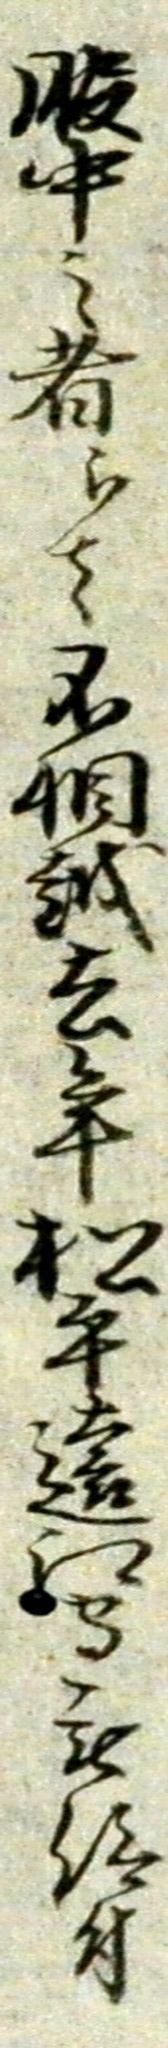服中之者江者不相越去年松平遠江守被仰付
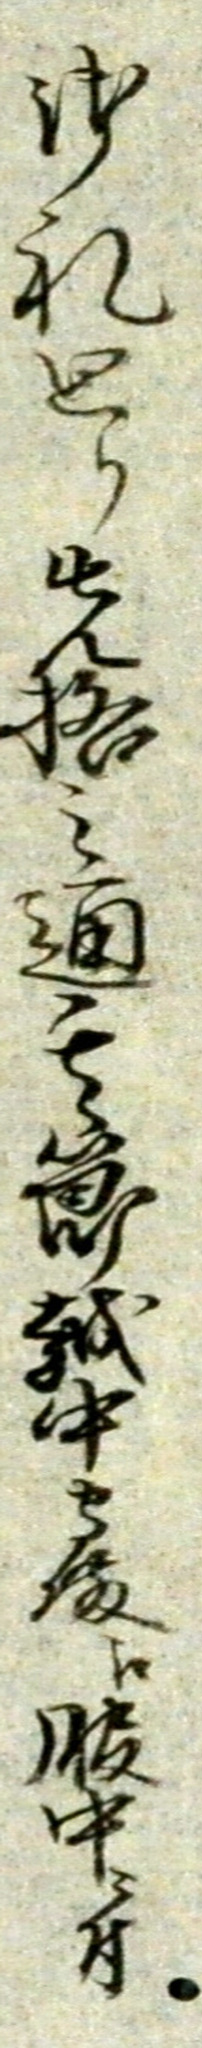御礼廻り先格之通其節越中守殿江服中ニ付
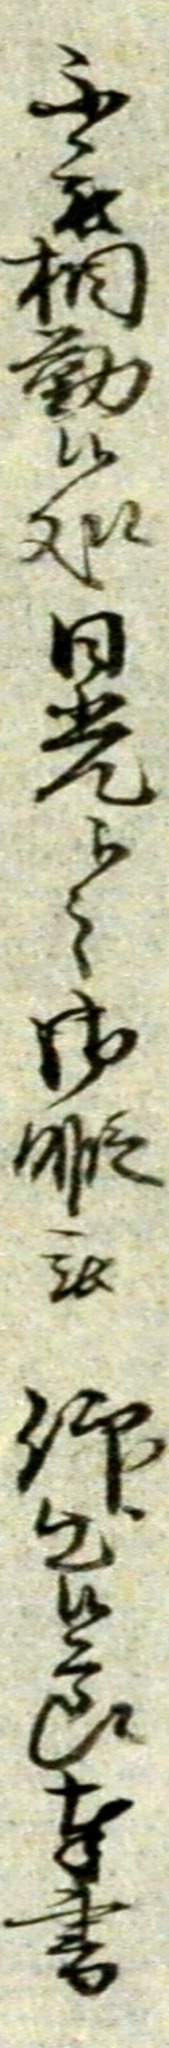不被相勤候処日光江之御暇被仰出候節奉書
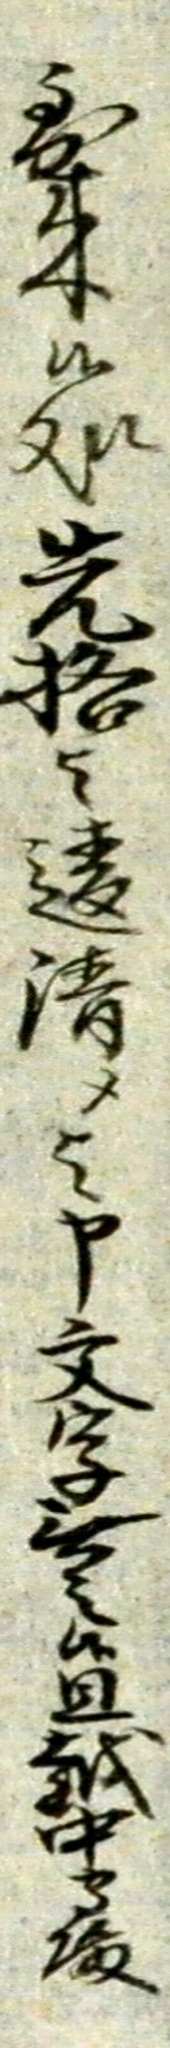到来候処先格と違清メと申文字無之候且越中守殿
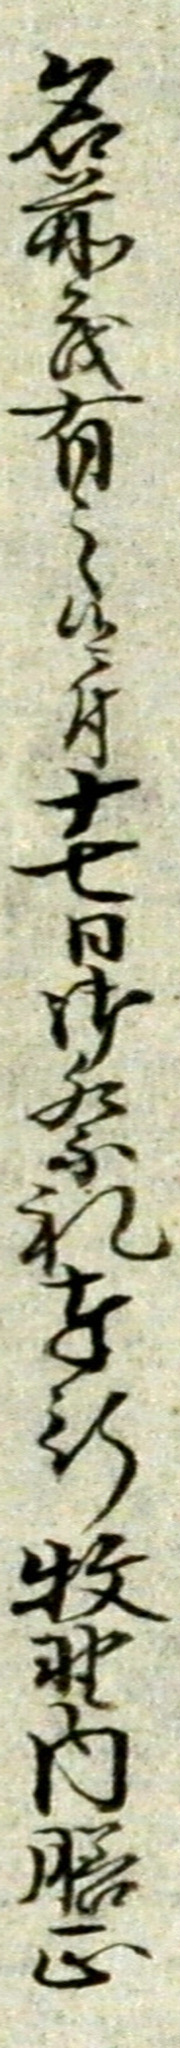名前も有之候ニ付十七日御祭礼奉行牧野内膳正
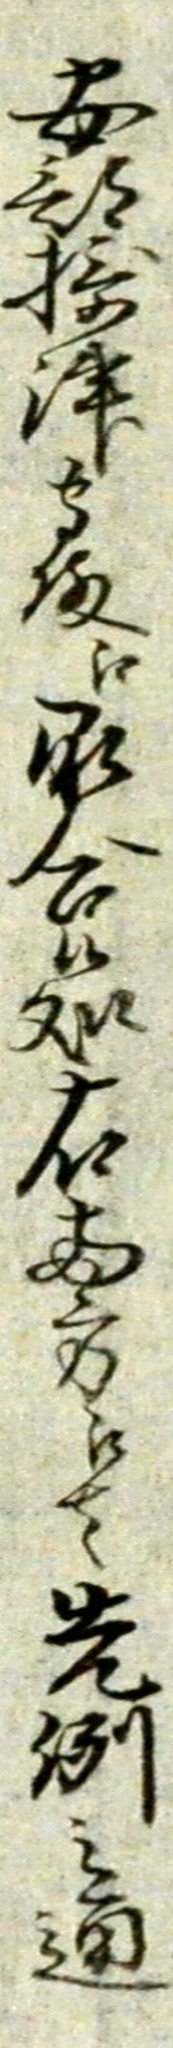安部摂津守殿江承合候処右両方江者先例之通
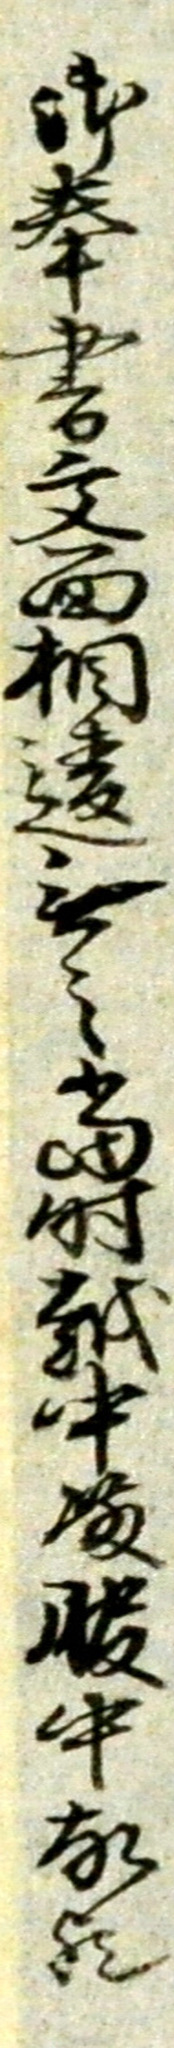御奉書文面相違無之当時越中殿服中故歟
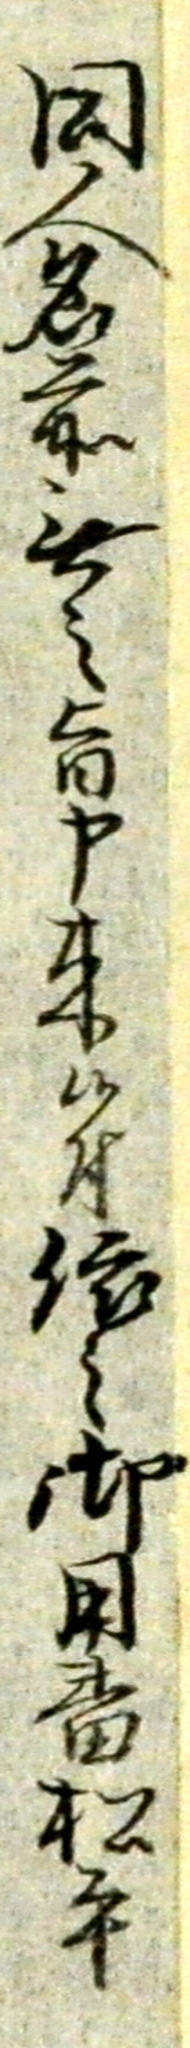同人名前無之旨申来候付依之御用番松平
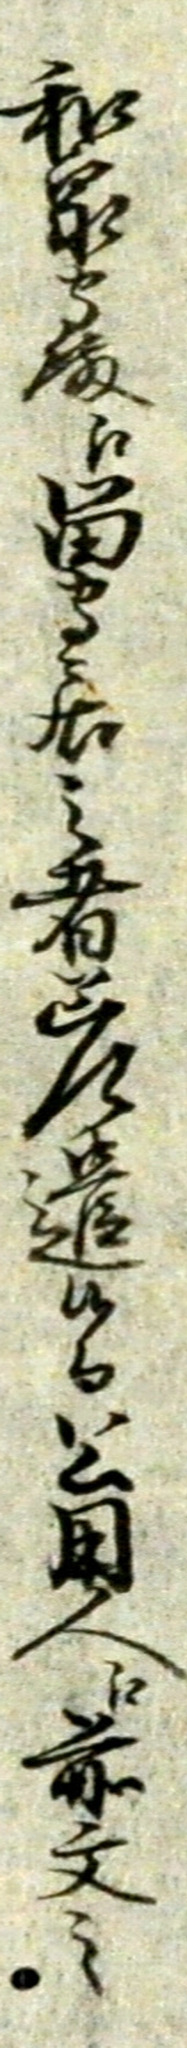和泉守殿江留守居之者差遣候而公用人江前文之
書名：日光御名代相勤候節ノ留
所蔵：伊那市立高遠町図書館・合同会社AMANE
